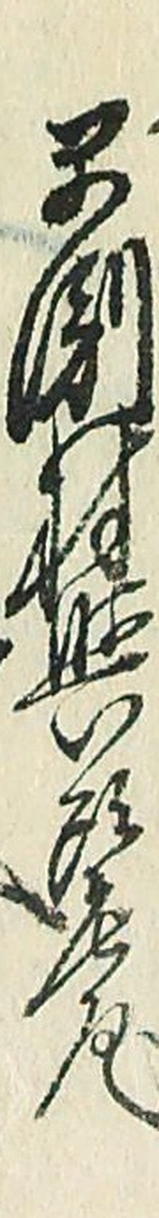早淵村与頭庄屋
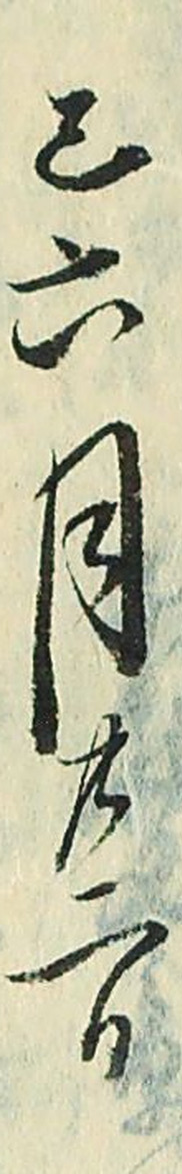巳六月廿二日
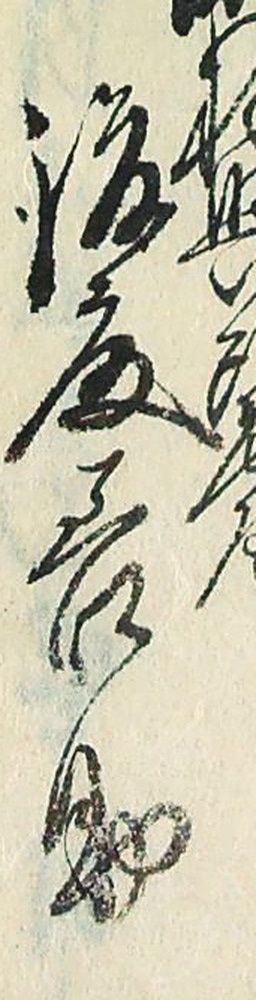後藤善助
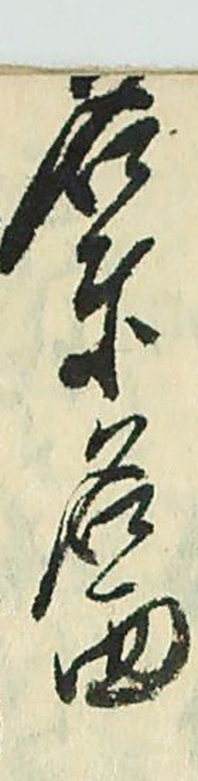名東名西
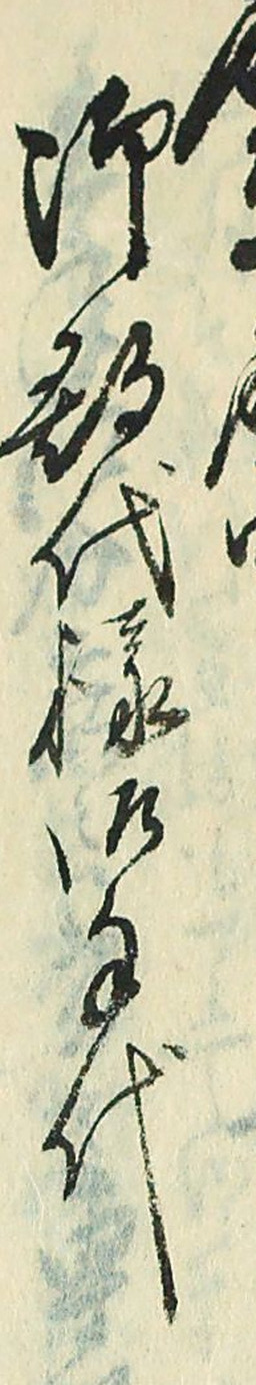御郡代様御手代
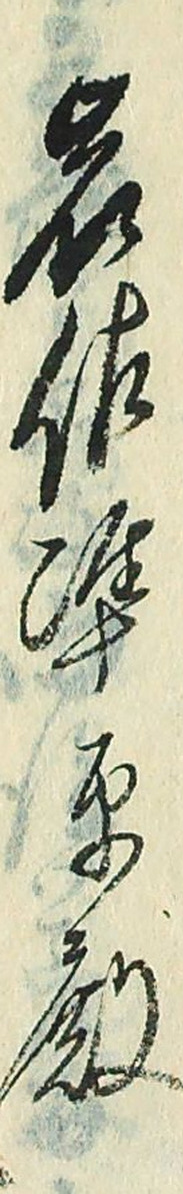岩佐準平殿
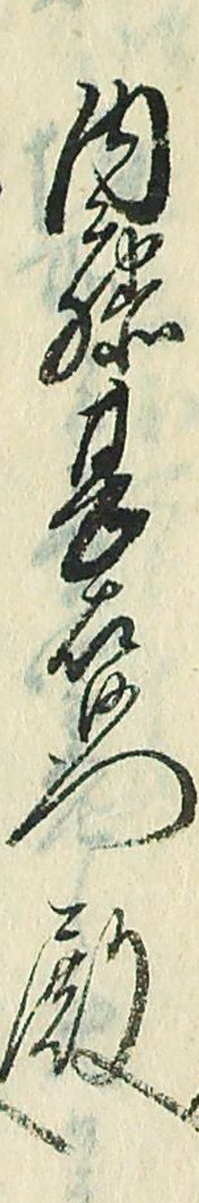内藤甚右衛門殿
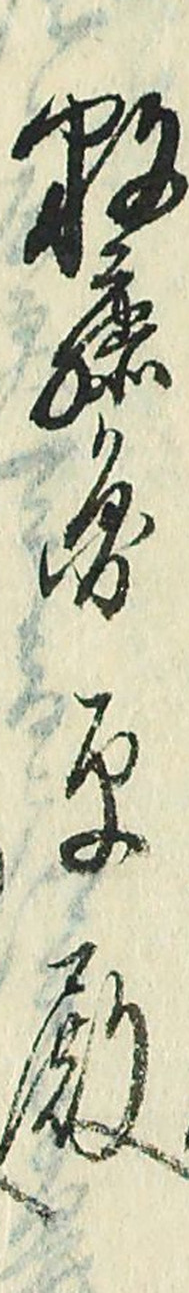数藤円平殿
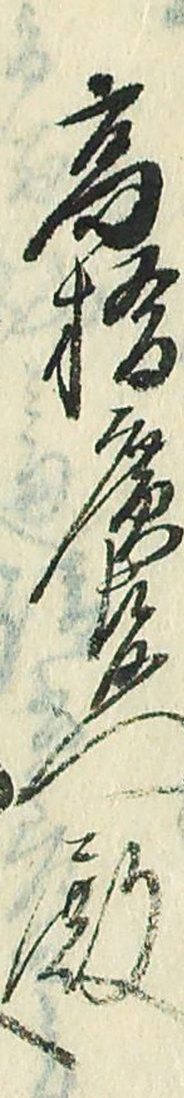高橋広左衛門殿
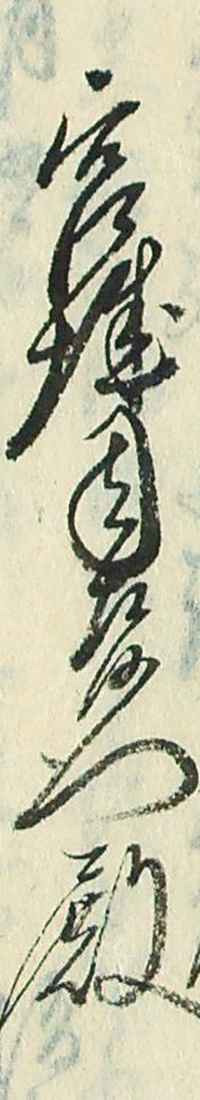宮城周左衛門殿

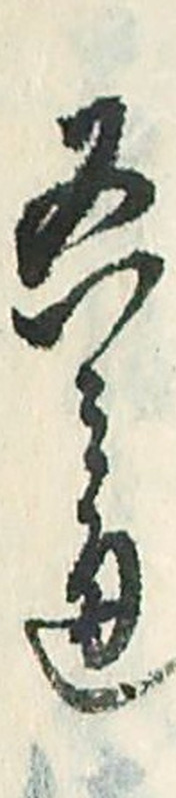右之通
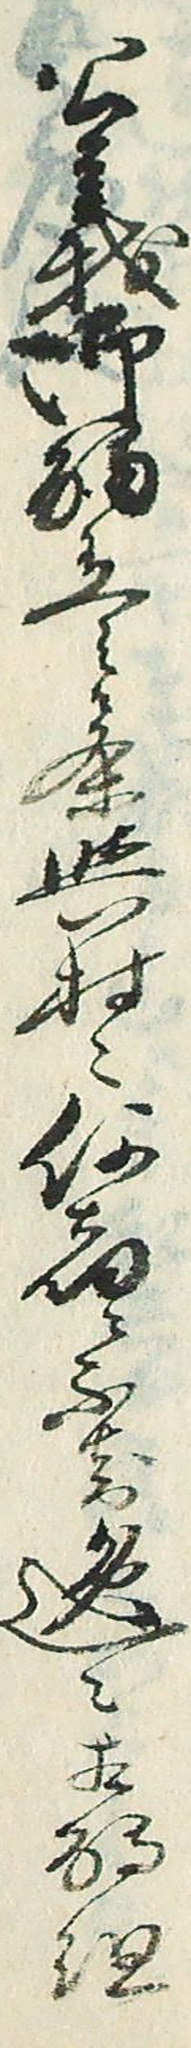公義御触有之候条与村々何者不寄逸々相触組
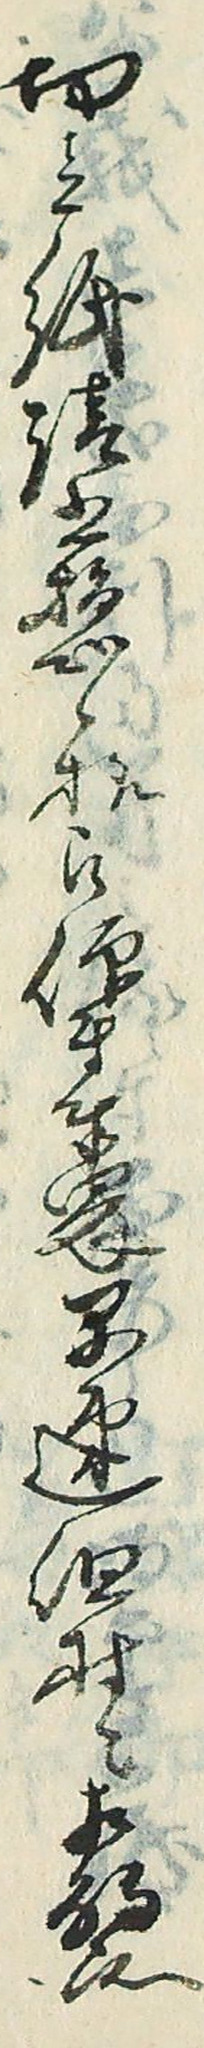切壱紙請書指出候様被仰付奉畏早速組村々相触候所
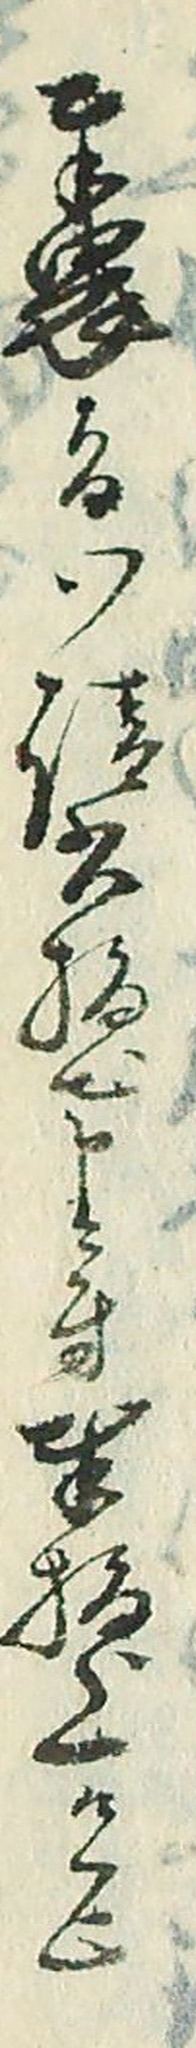奉畏旨御請書指出申に付奉指上候以上
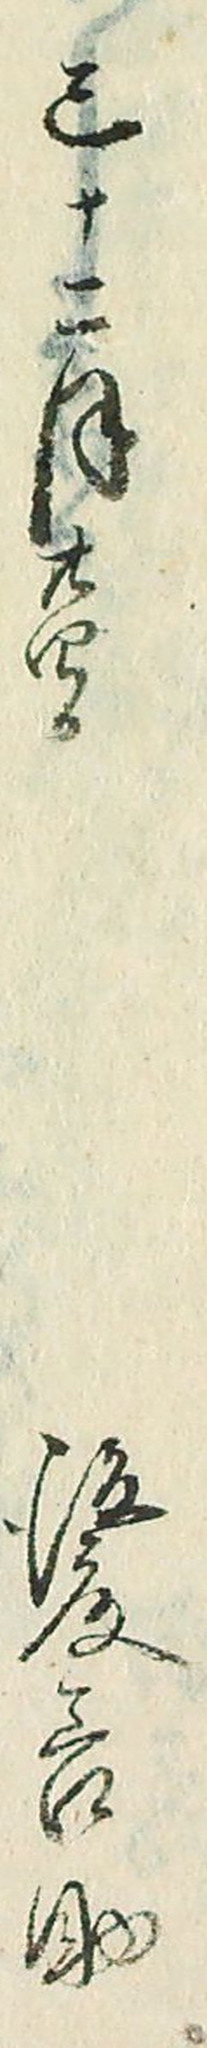巳十二月廿四日後藤善助
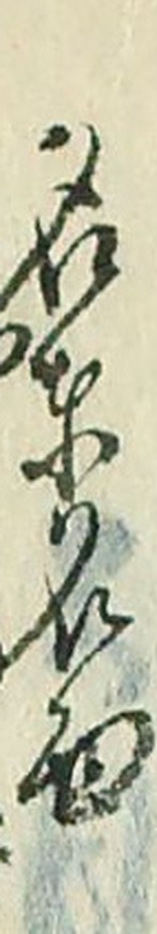名東名西
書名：諸御用御□受書控
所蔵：鳴門教育大学 Naruto University of Education
